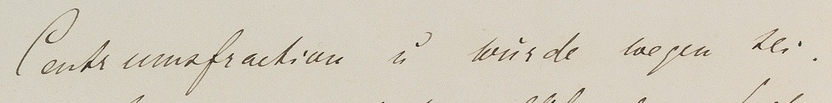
Centrumsfraction u wurde wegen sei-
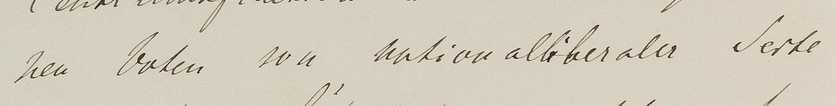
nen Voten von nationalliberaler Seite
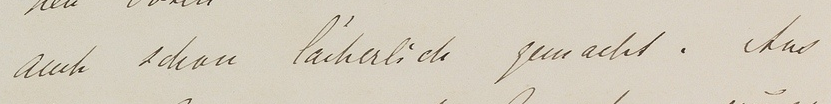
auch schon lächerlich gemacht. Aus
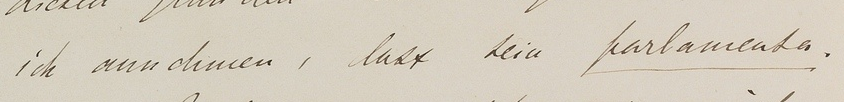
ich annehmen, dass sein parlamenta-
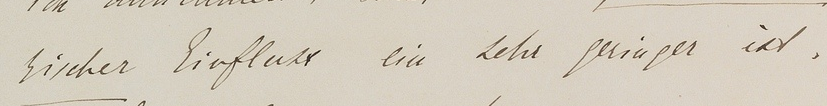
rischer Einfluss ein sehr geringer ist.
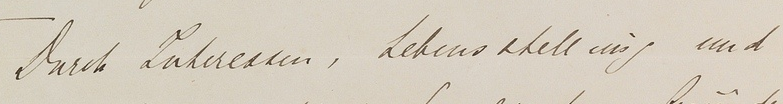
Durch Interessen, Lebensstellung und
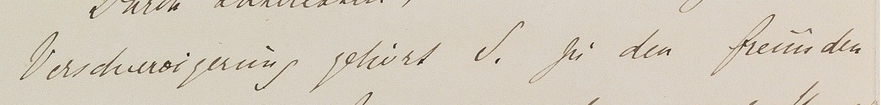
Verschwägerung gehört S. zu den Freunden
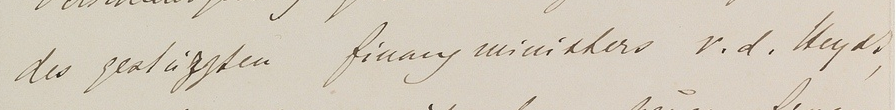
des gestürzten Finanzministers v.d. Heydt,
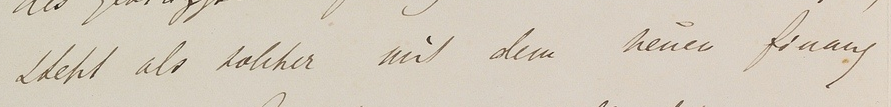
steht als solcher mit dem neuen Finanz-
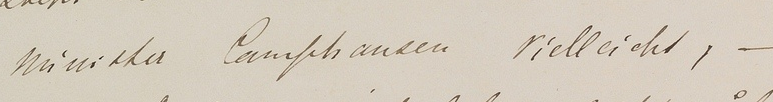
minister Camphausen vielleicht, –
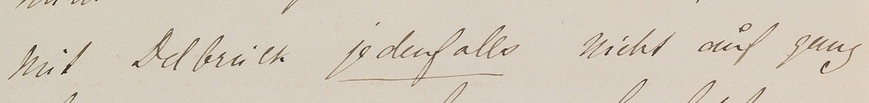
mit Delbrückjedenfalls nicht auf ganz
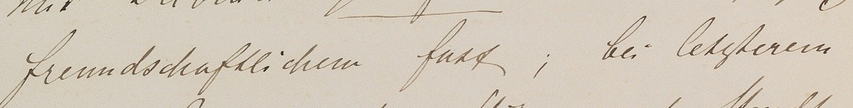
freundschaftlichem Fuss; bei letzterem
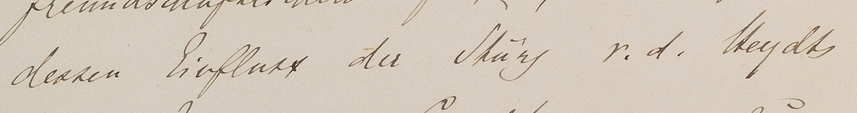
dessen Einfluss der Sturz v.d. Heydts
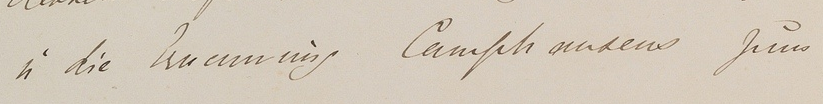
u die Ernennung Camphausens zum
